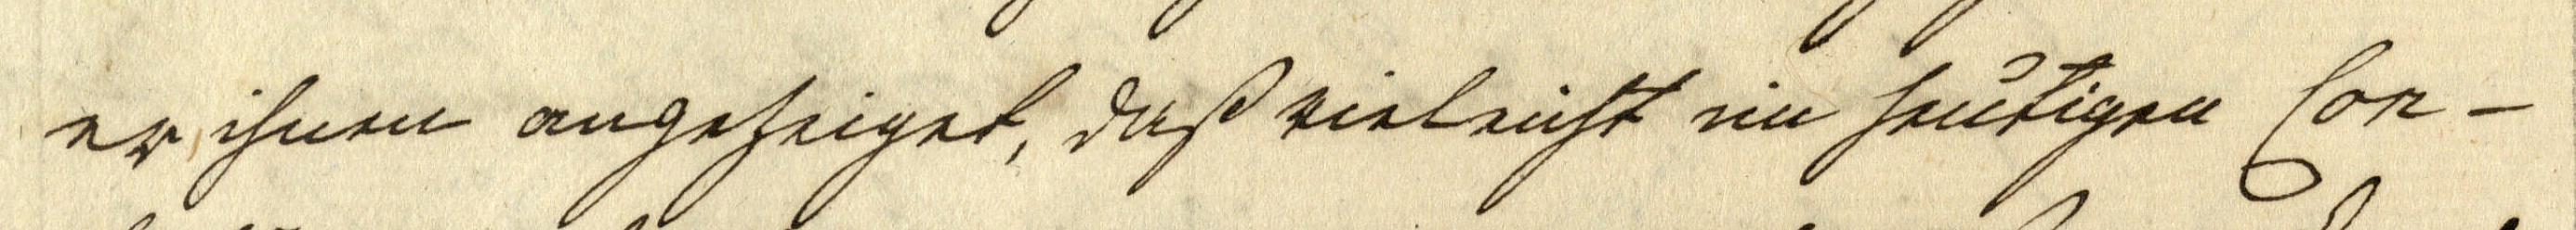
er ihnen angezeiget, daß vieleicht im heutigen Con-
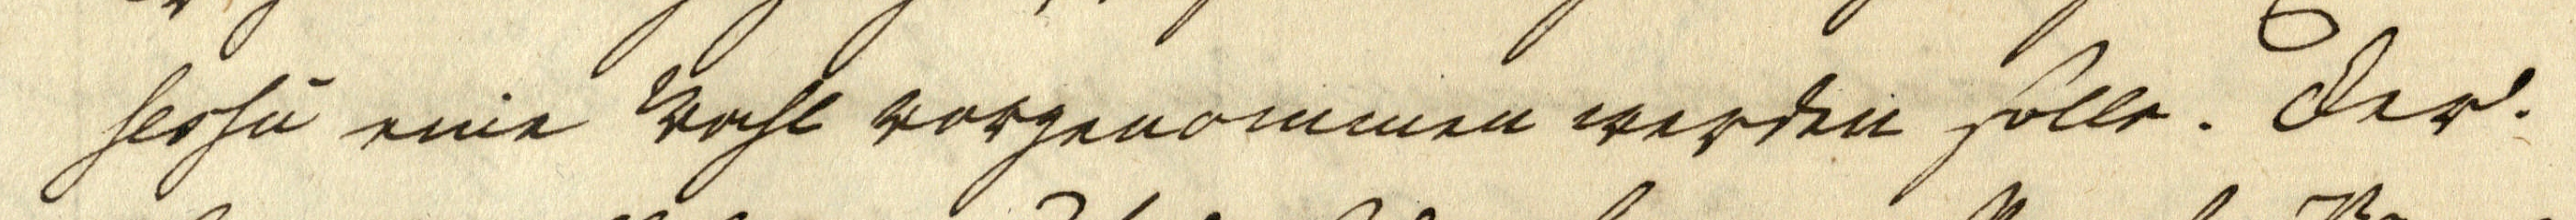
sessu eine Wahl vorgenommen werden solle. Der-
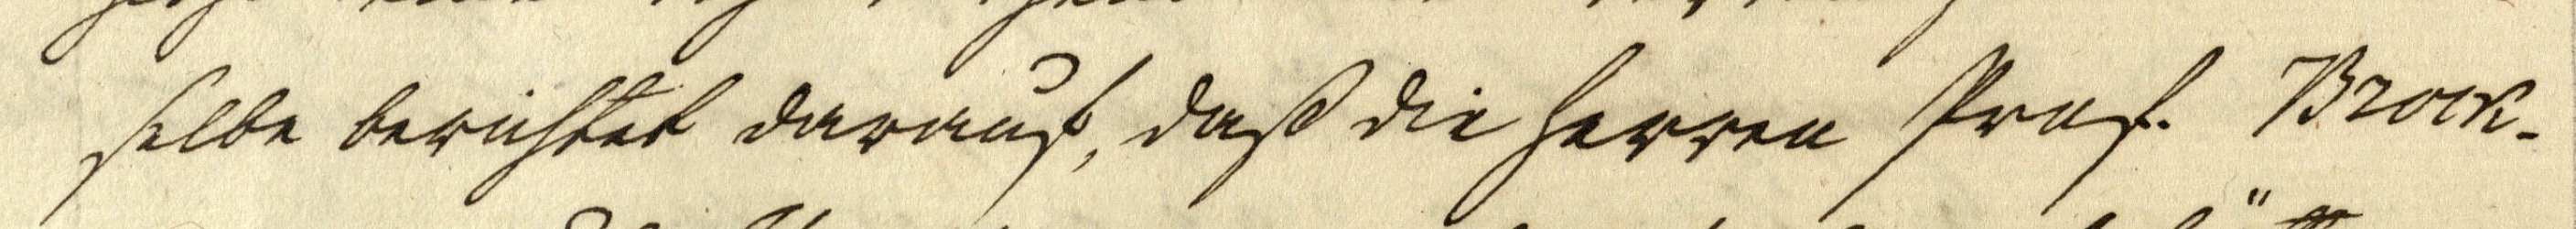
selbe berichtet darauf, daß die herren Prof. Brock-
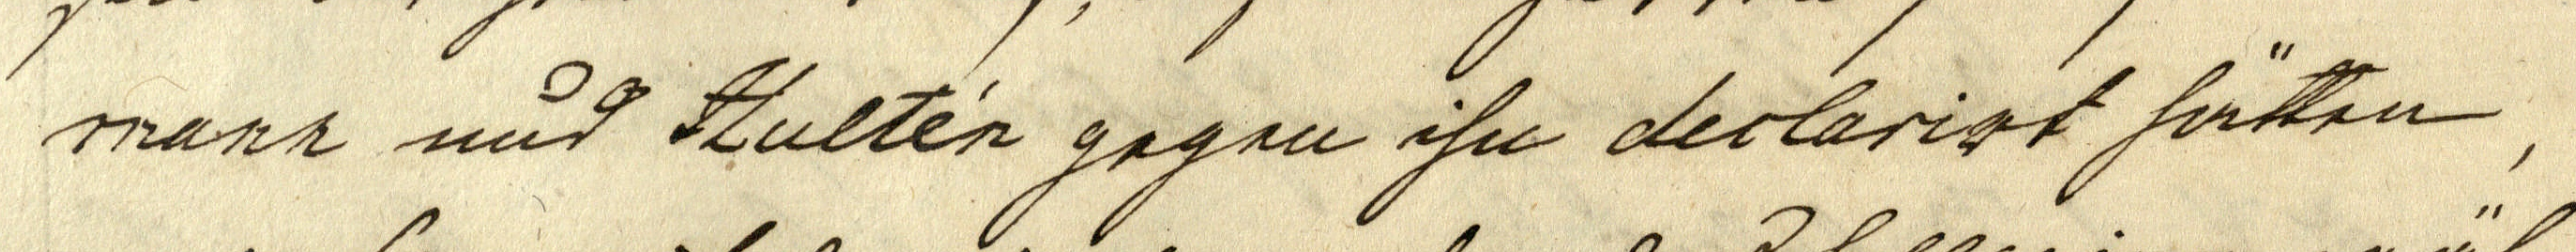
mann und Hultén gegen ihn declarirt hätten
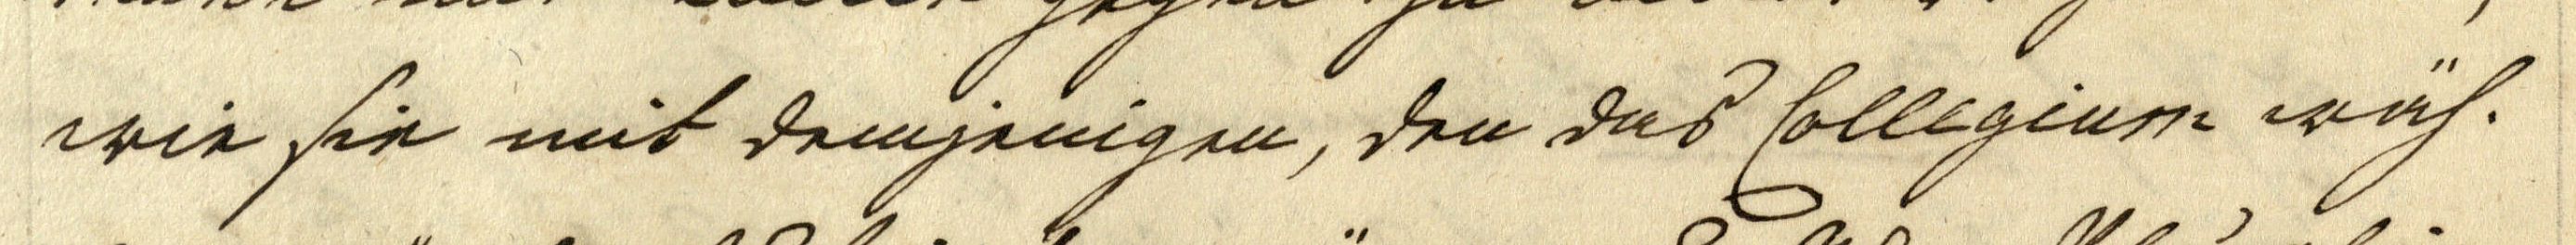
wie sie mit demjenigen, den das Collegium wäh-
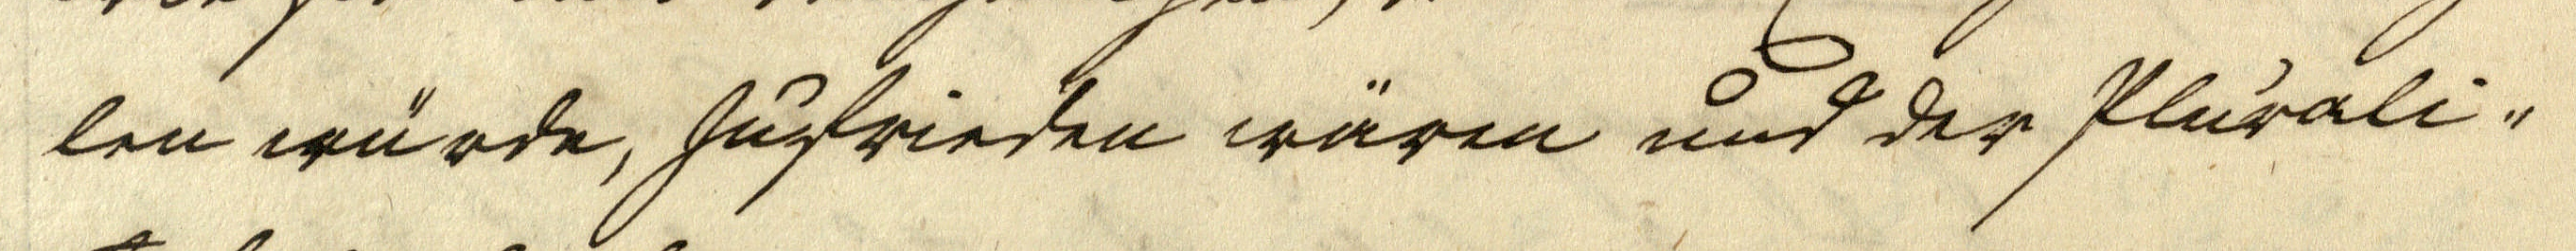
len würde, zufrieden wären und der Plurali-
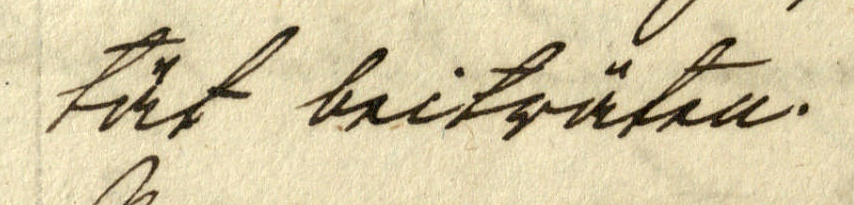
tät beiträten.
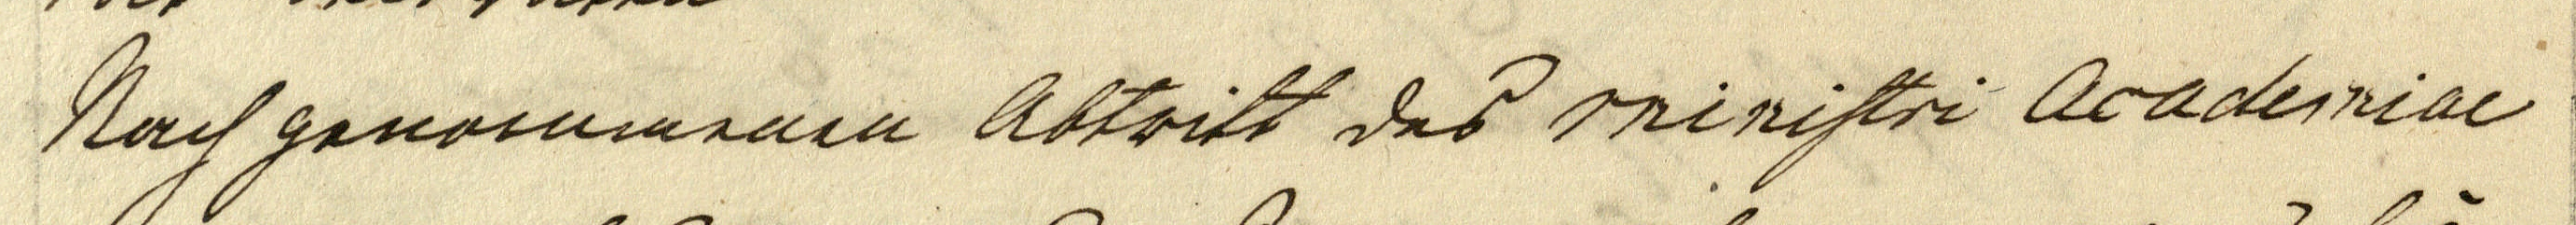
Nach genommenen Abtritt des Ministri Academiae
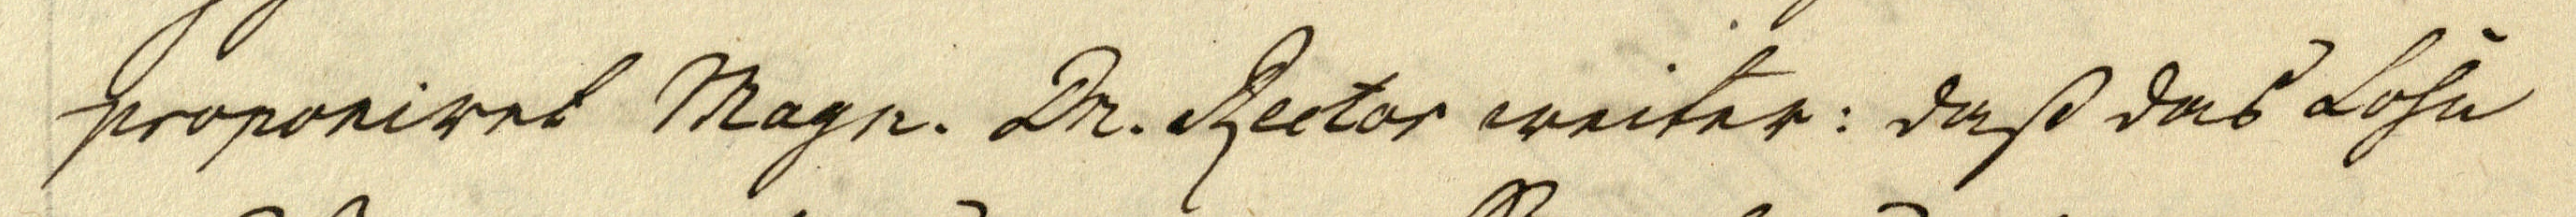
proponiret Magn. Dn. Rector weiter: daß das Lohn
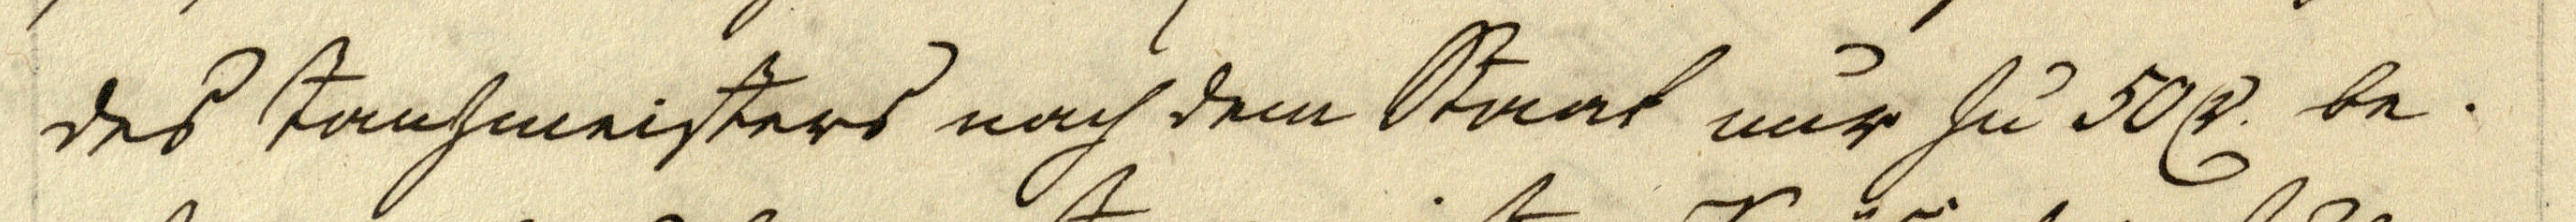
des Tanzmeisters nach dem Staat nur zu 50 rtl be-
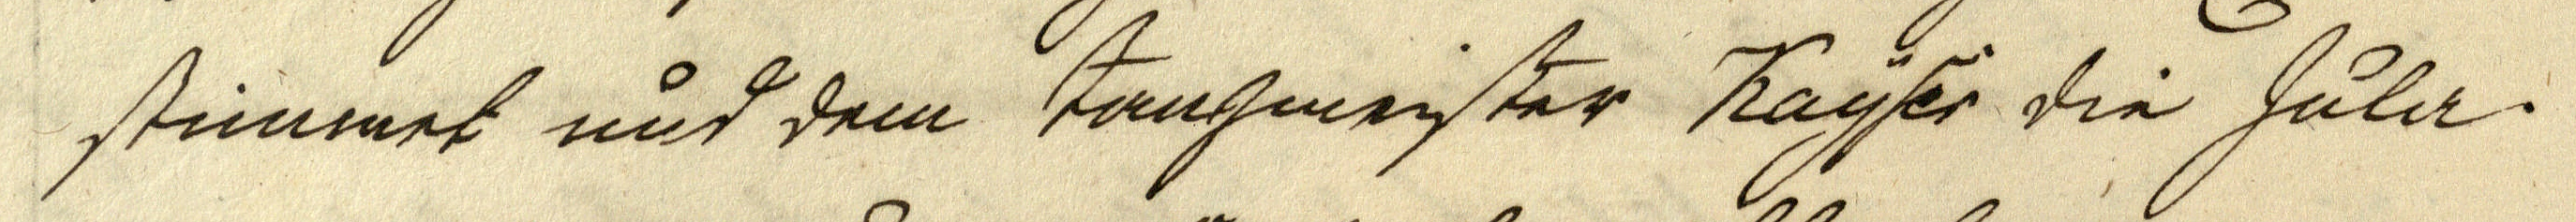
stimmet und dem Tanzmeister Kayser die Zula-
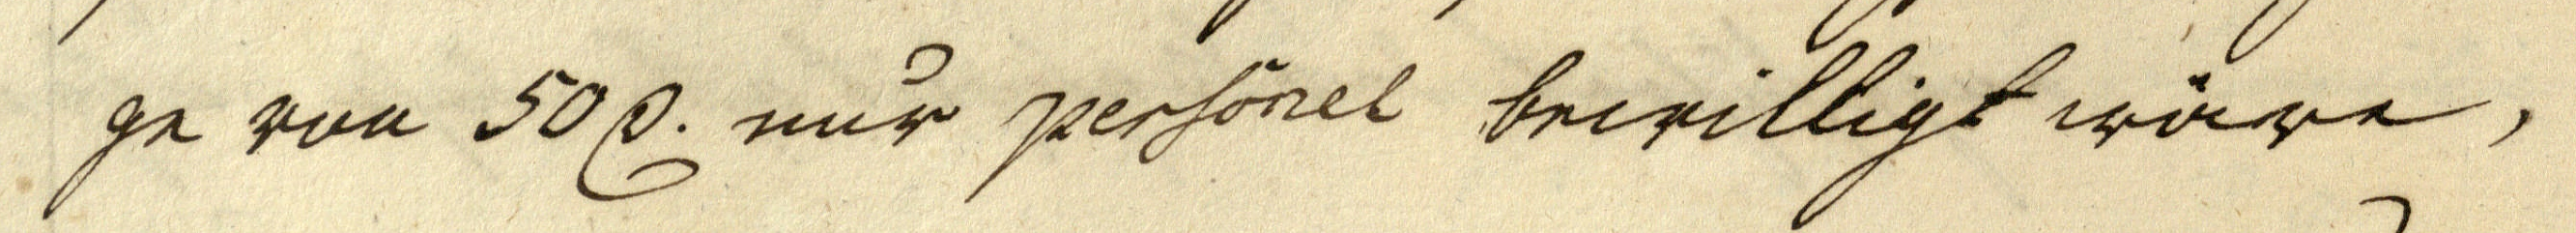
ge von 50 rtl nur personel bewilligt wäre,
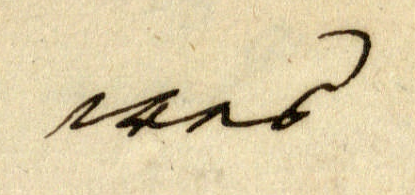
was
